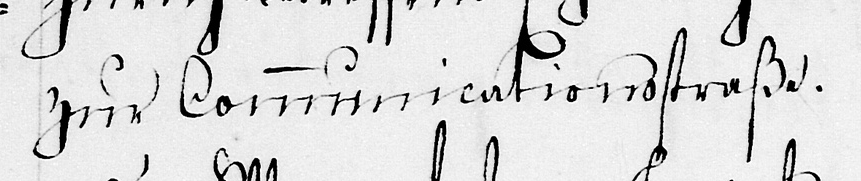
zur Communicationsstraße.
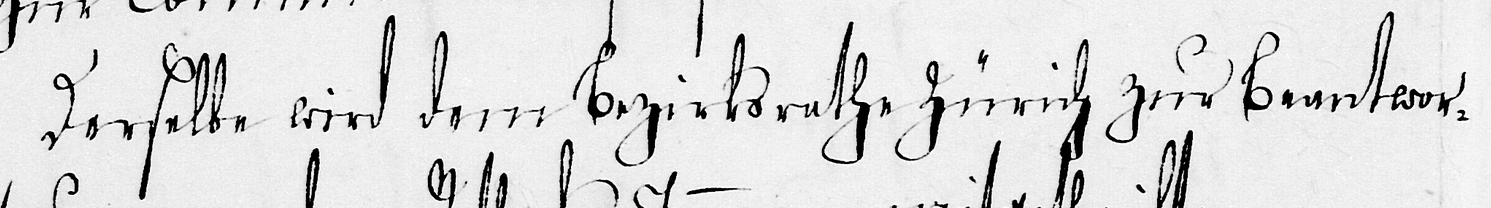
Derselbe wird dem Bezirksrathe Zürich zur Beantwor¬
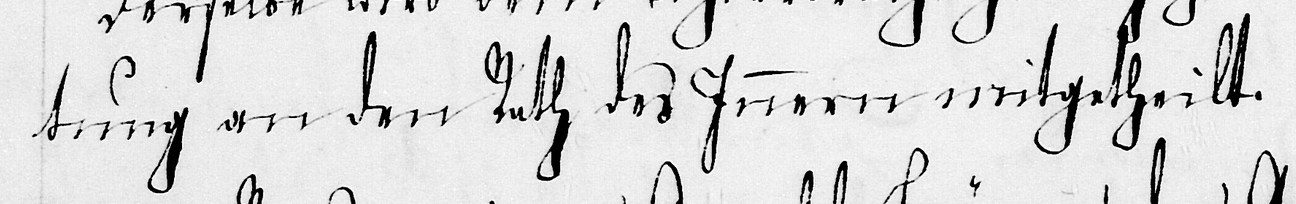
tung an den Rath des Innern mitgetheilt.
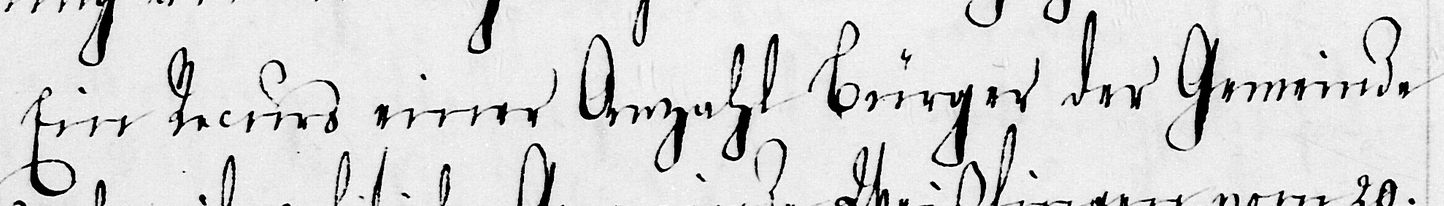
Ein Recurs einer Anzahl Bürger der Gemeinde
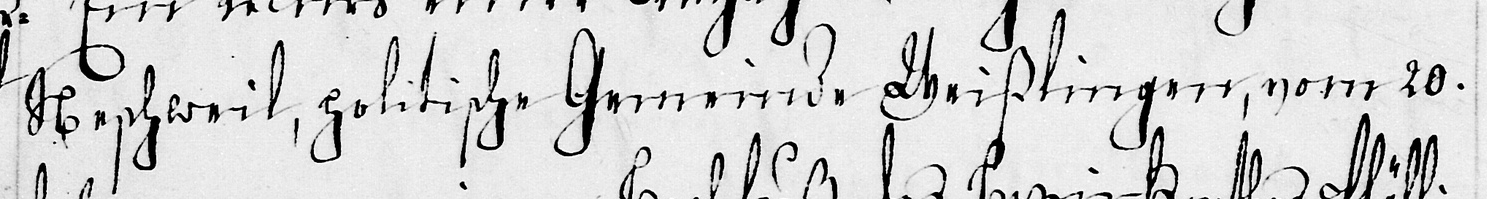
Neschweil, politische Gemeinde Weißlingen, vom 20.
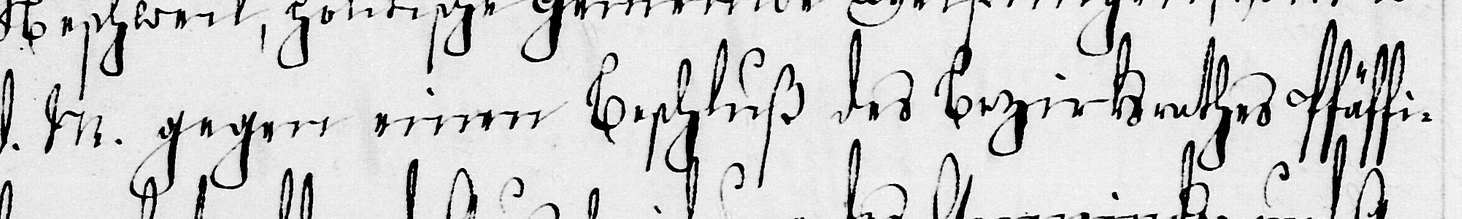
M. gegen einen Beschluß des Bezirksrathes Pfäffi¬
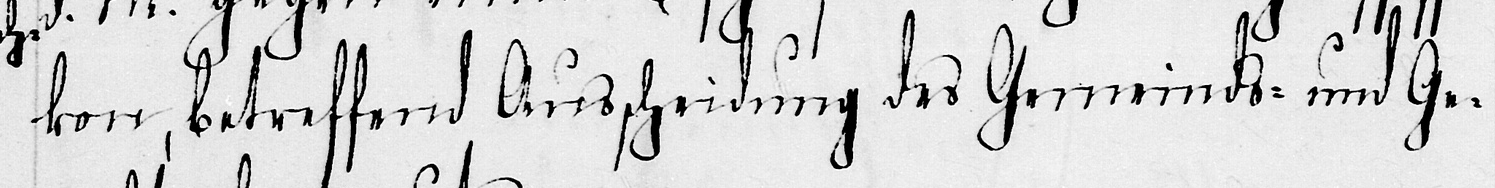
kon, betreffend Ausscheidung des Gemeinds- und Ge¬
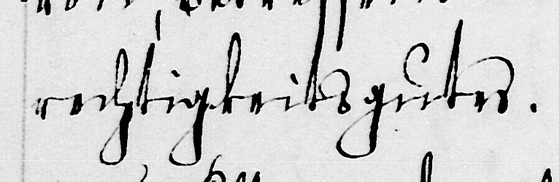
rechtigkeitsgutes.
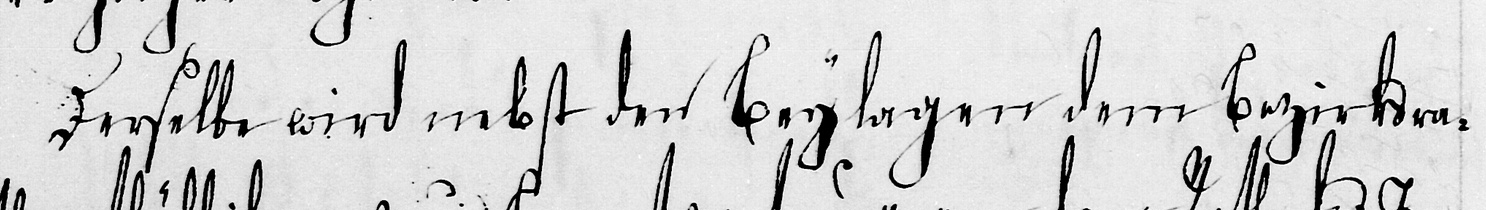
Derselbe wird nebst den Beylagen dem Bezirksra¬
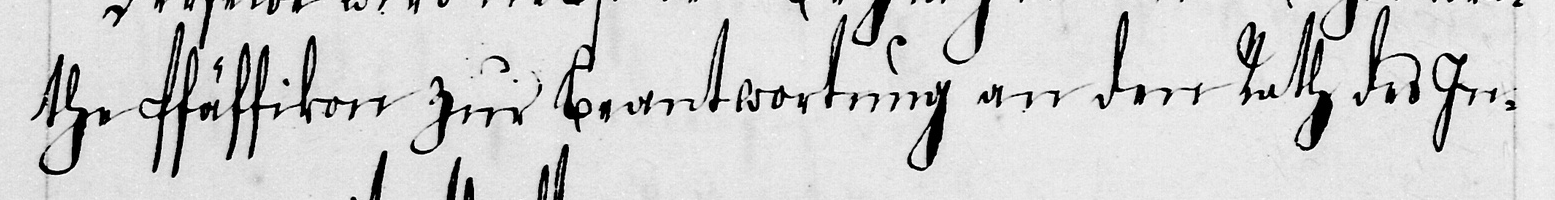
the Pfäffikon zur Beantwortung an den Rath des In¬
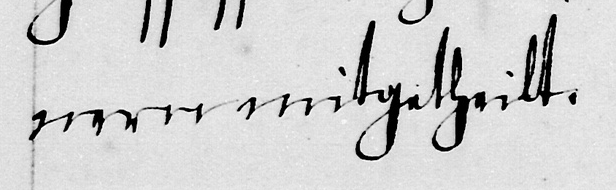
nern mitgetheilt.
